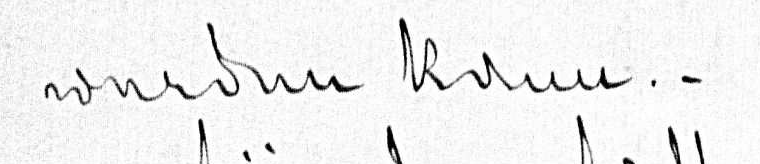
werden kann.
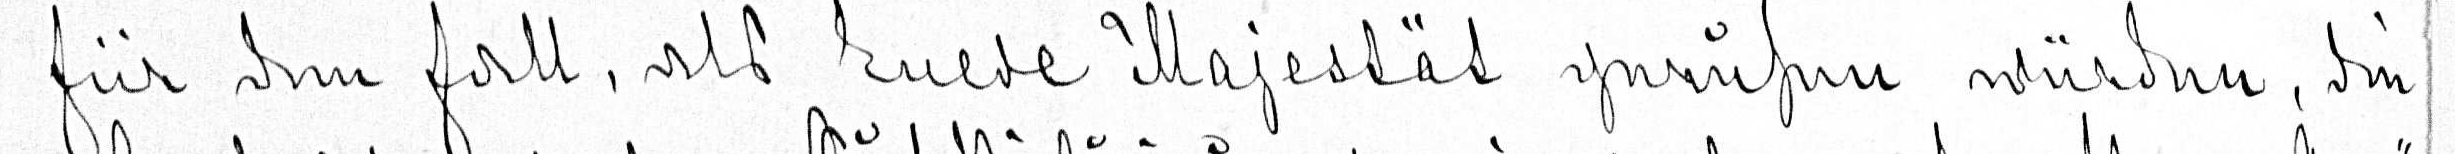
Für den Fall, als Euere Majestät geruhen würden, die¬
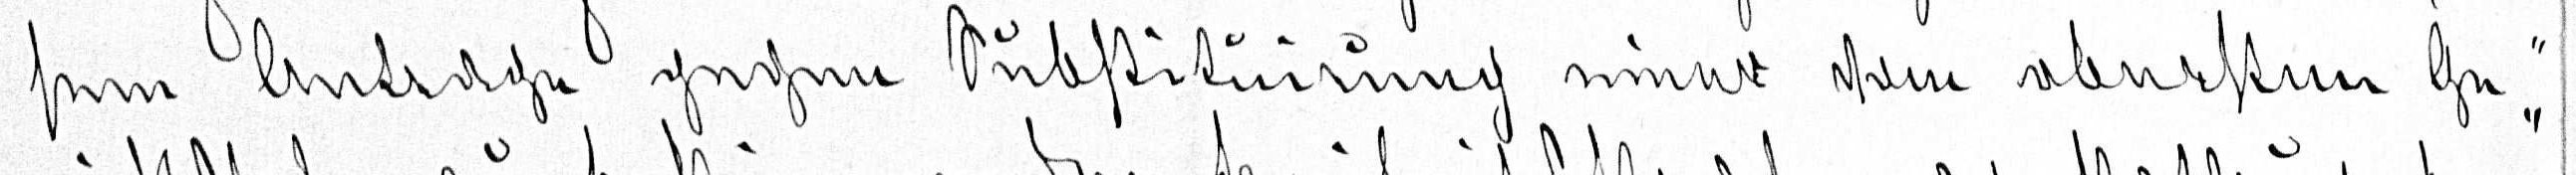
sem Antrage gegen Substituirung einer vom obersten Ge¬
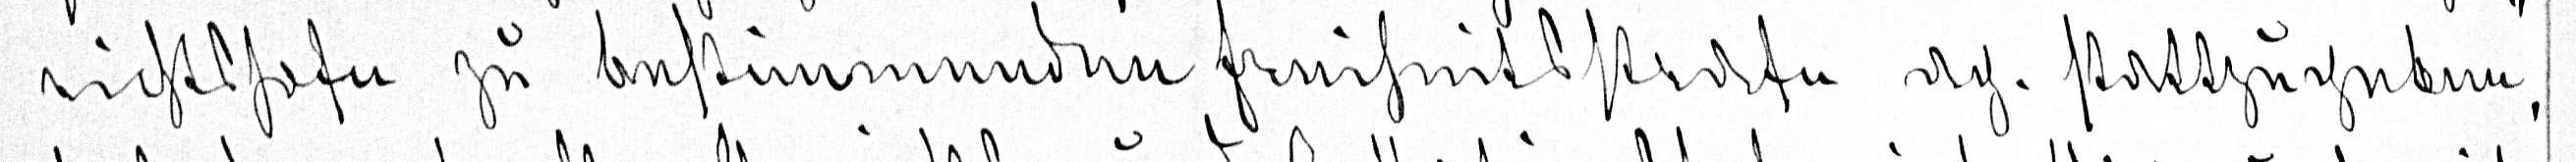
richtshofe zu bestimmenden Freiheitssprache ag. stattzugeben,
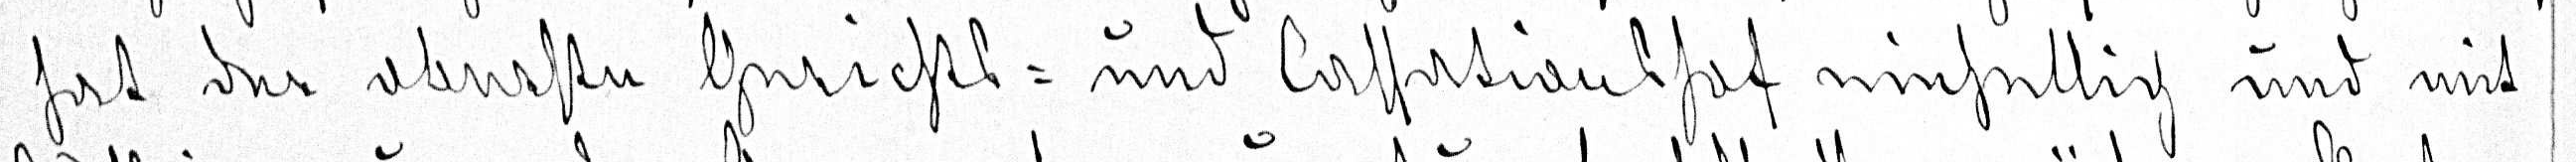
hat der oberste Gerichts- und Cassationshof einhellig und mit
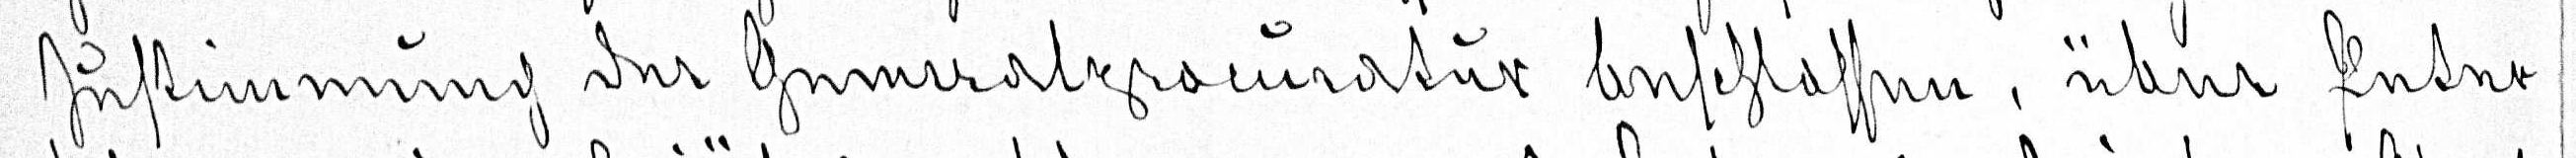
Zustimmung der Generalprocuratur beschlossen, über Peter
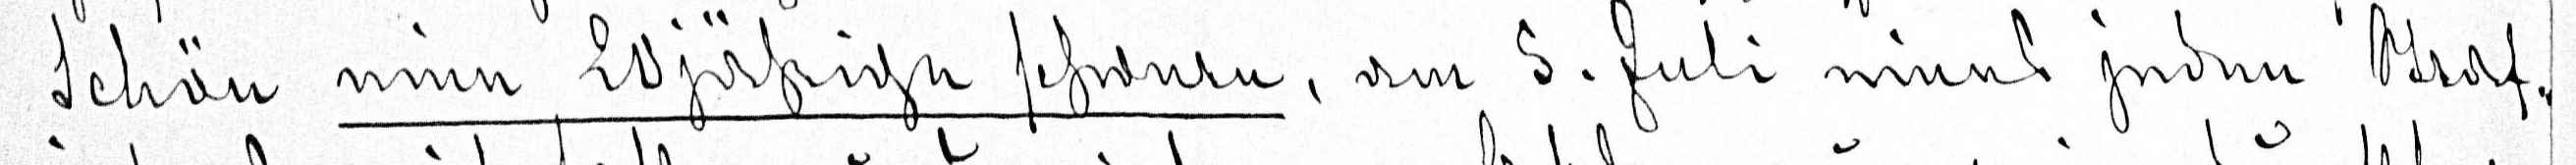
Schön eine 20jährige schwere, am 5. Juli eines jeden Straf¬
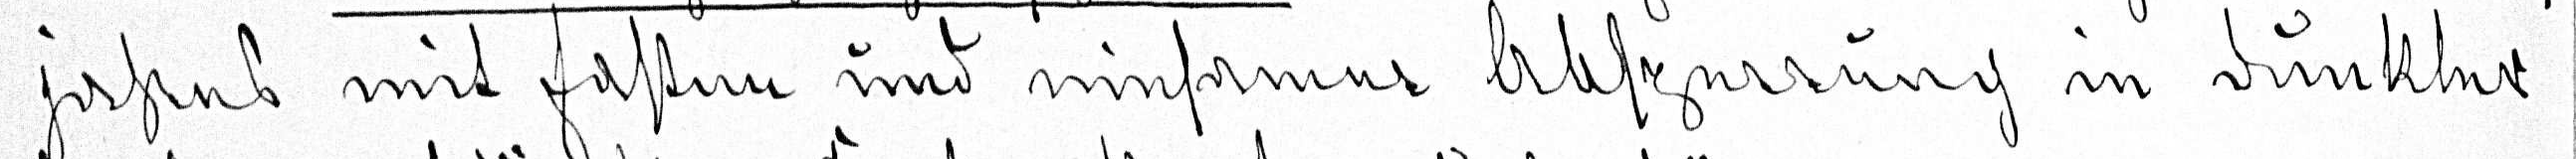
jahres mit Fasten und einsamer Absperrung in dunkler
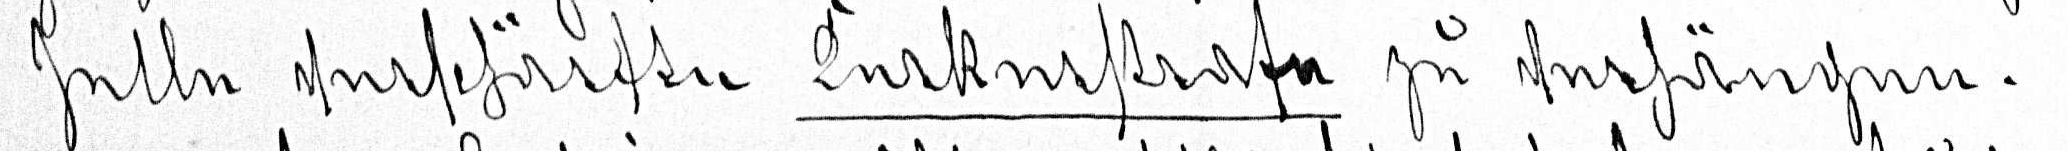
Zelle verschärften Kerkerstrafe zu verschärfen.
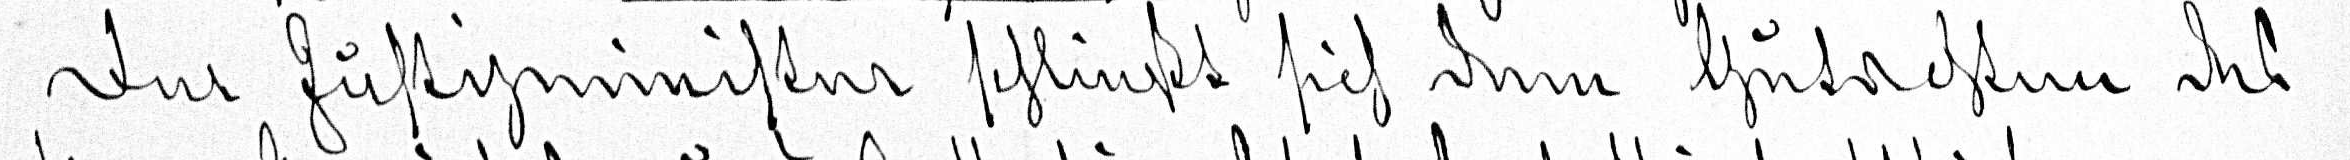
Der Justizminister schließt sich dem Gutachten des
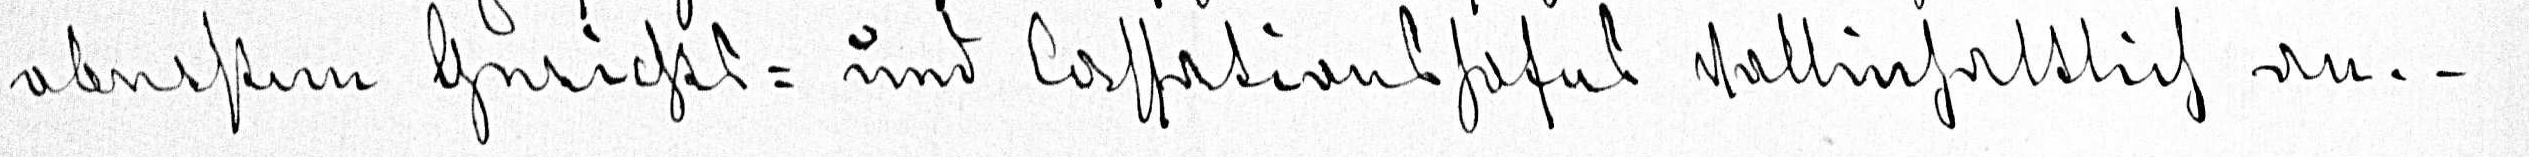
obersten Gerichts- und Cassationshofes vollinhaltlich an.
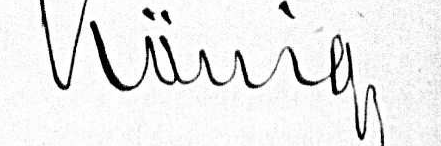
König
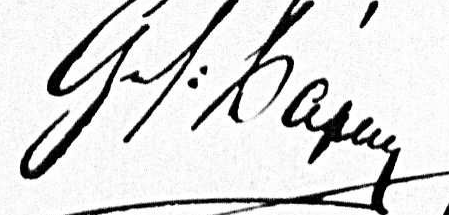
Ges. Papay
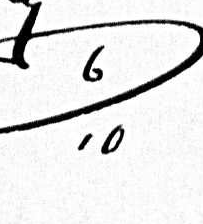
6/10
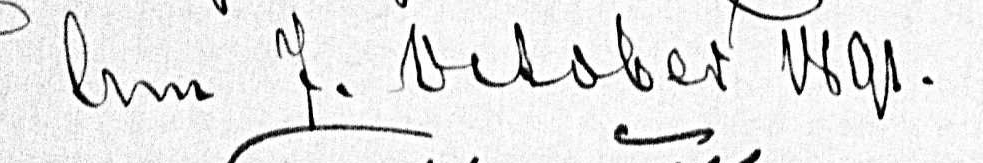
Am 7. October 1891
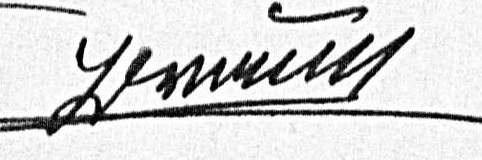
Braun
